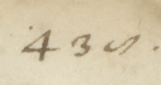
438
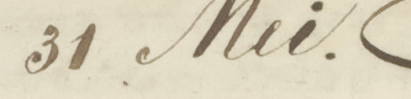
31. Mei.
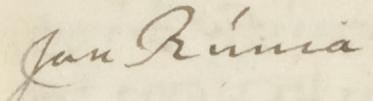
Jan Runia
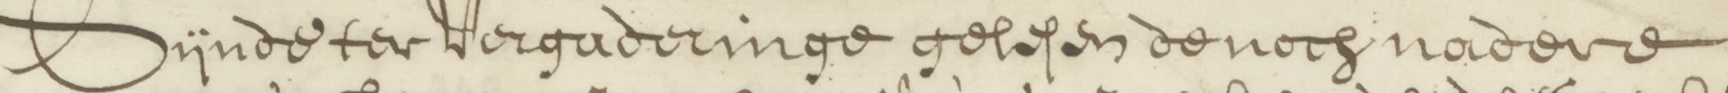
Sijnde ter Vergaderinge gelesen de noch nadere
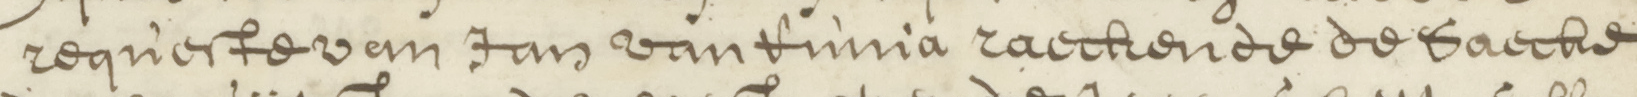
requeste van Jan van Runia raeckende de Saecke
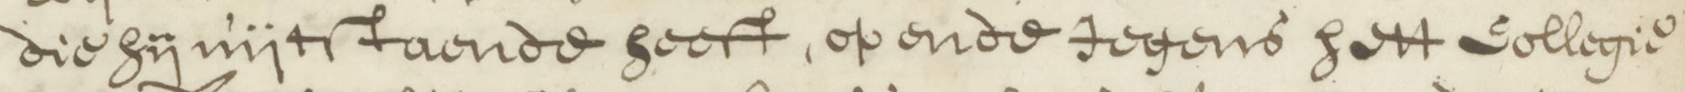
die hij uijtstaende heeft, op ende Jegens hett Collegie
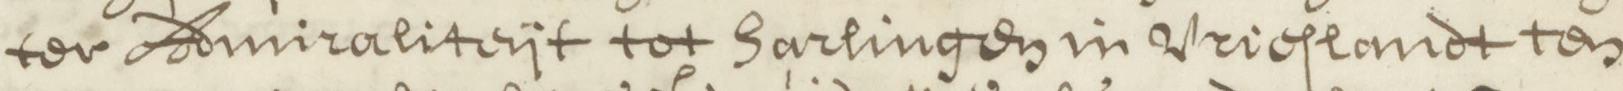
ter Admiraliteijt tot harlingen in Vrieslandt ten
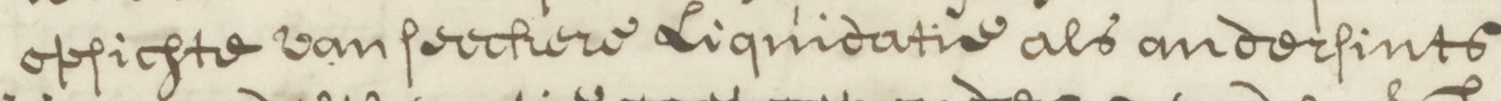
opsichte van seeckere Liquidatie als andersints
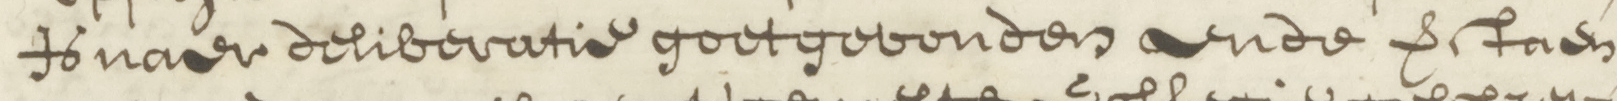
Is naer deliberatie goetgevonden ende vstaen
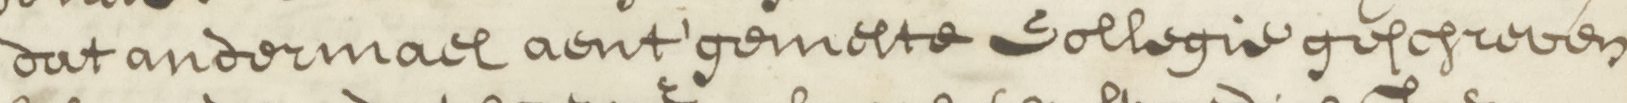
dat andermael aent' gemelte Collegie geschreven
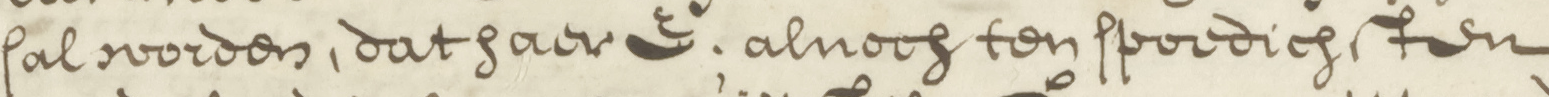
sal worden, dat haer E. alnoch ten spoedichsten
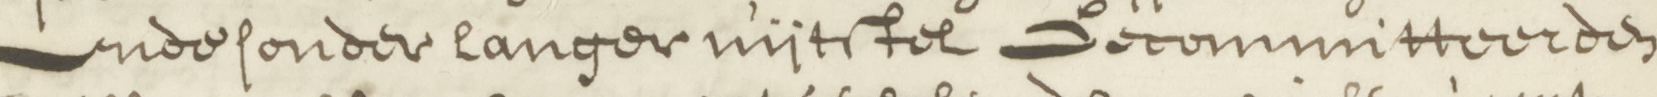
ende sonder langer uijtstel Gecommitteerden
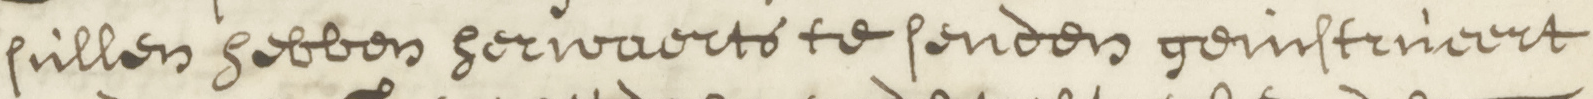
sullen hebben herwaerts te senden geinstrueert
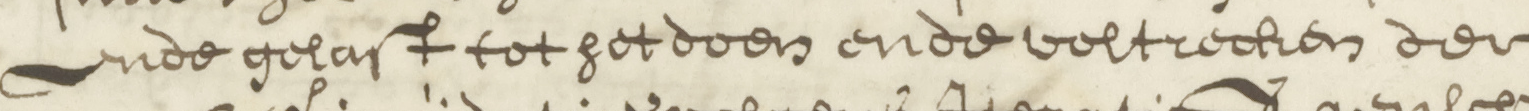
Ende gelast tot het doen ende voltrecken der
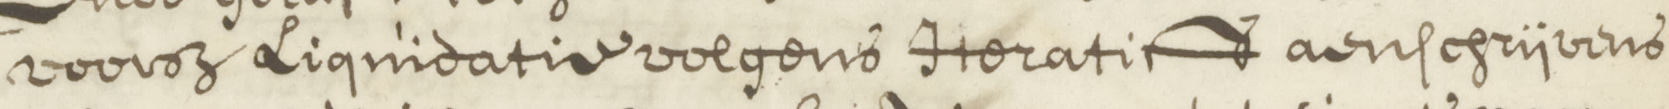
voorsz Liquidatie volgens Iteratiff aenschrijvens
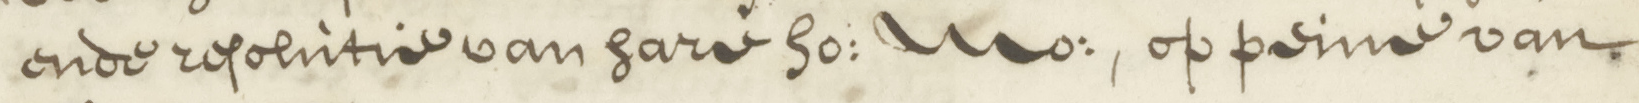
ende resolutie van hare ho:Mo:, op peine van
